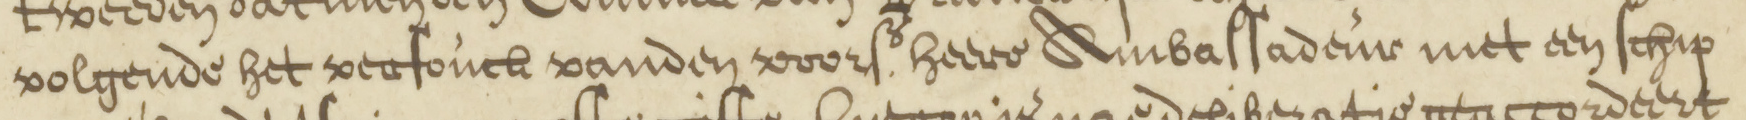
volgende het versouck vanden voors. heere Ambassadeur met een schip
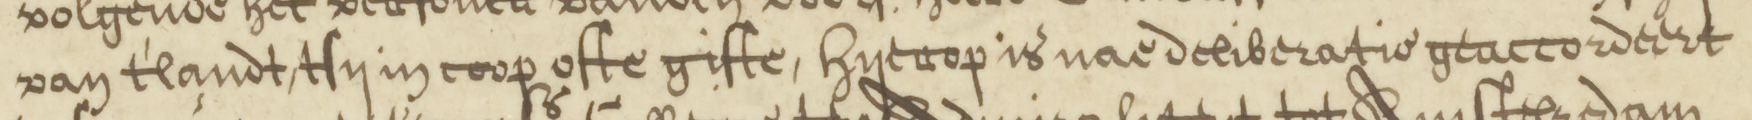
van t‛landt, tsy in coop ofte gifte, hyerop is nae deliberatie geaccordeert
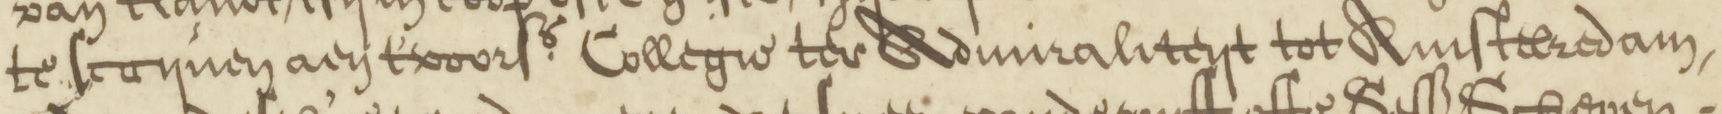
te scryuen aen t‛voors. Collegie ter Admiraliteyt tot Amstelredam,
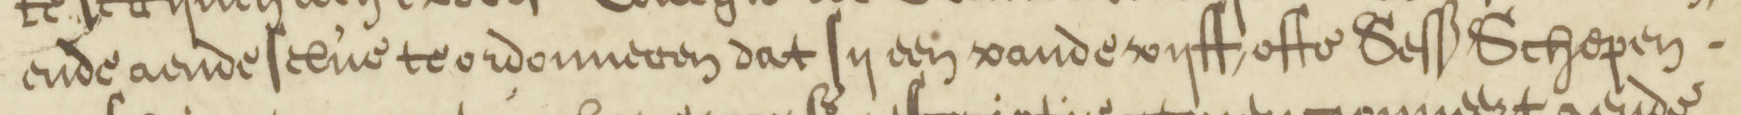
ende aende selue te ordonneren dat sy een vande vyff, ofte Sess Schepen,
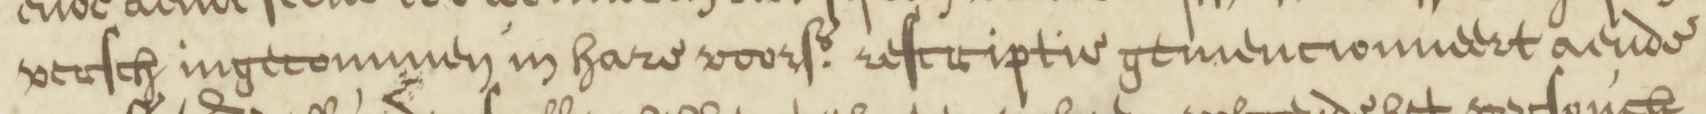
versch ingecommen in hare voors. rescriptie gemencionneert aende
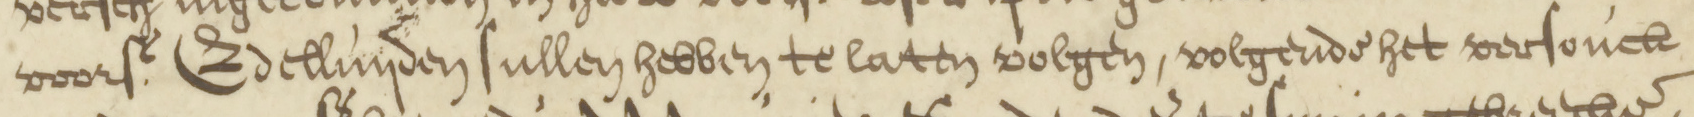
voors. Edelluyden sullen hebben te laten volgen, volgende het versouck
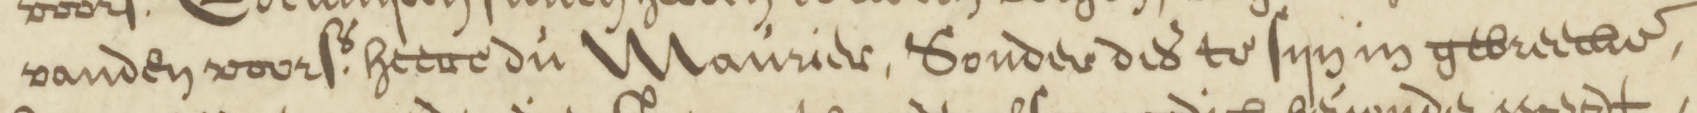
vanden voors. heere du Maurier, Sonder des te syn in gebreecke,
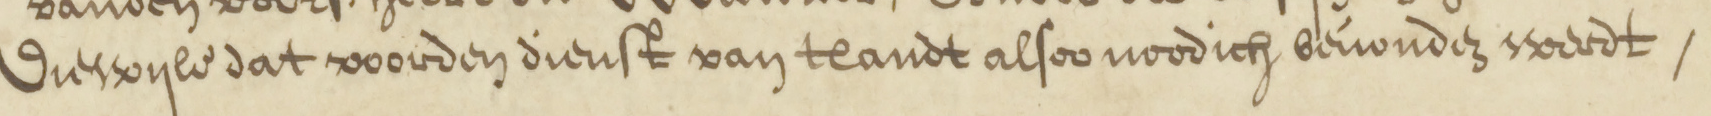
Diewyle dat voorden dienst van tlandt alsoo noodich, beuonden werdt.
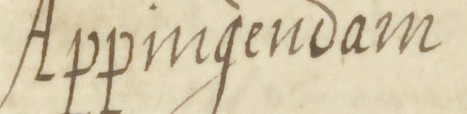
Appingendam
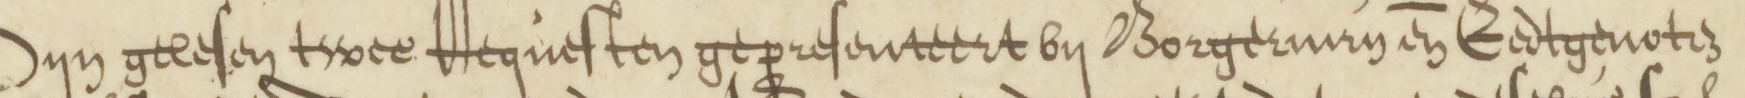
Syn gelesen twee Requesten gepresenteert by Borgermrn en Eedtgenoten
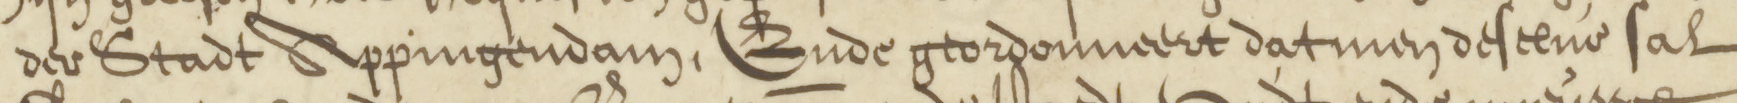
der Stadt Appingendam, Ende geordonneert dat men deselue sal
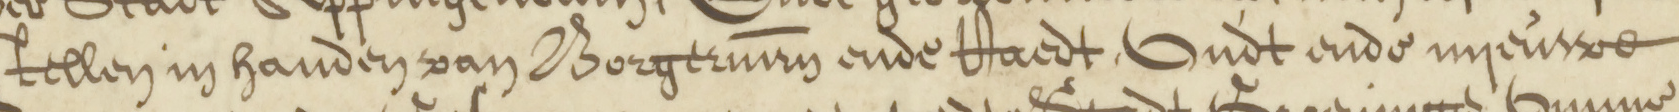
stellen in handen van Borgermrn ende Raedt, Oudt ende nyeuwe
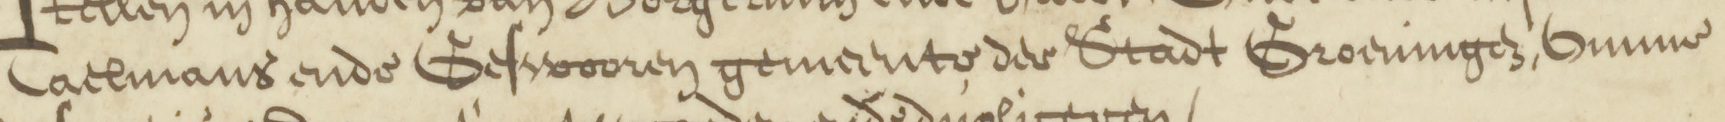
Taelmans ende Geswooren gemeente der Stadt Groeningen, omme
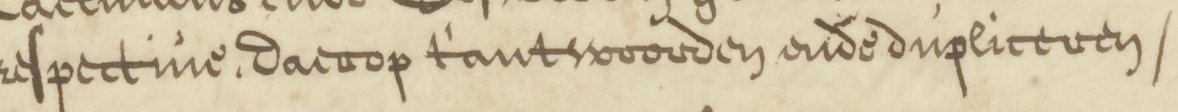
respectiue, daerop t'antwoorden ende dupliceren.
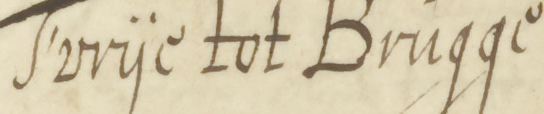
T‛vrije tot Brugge
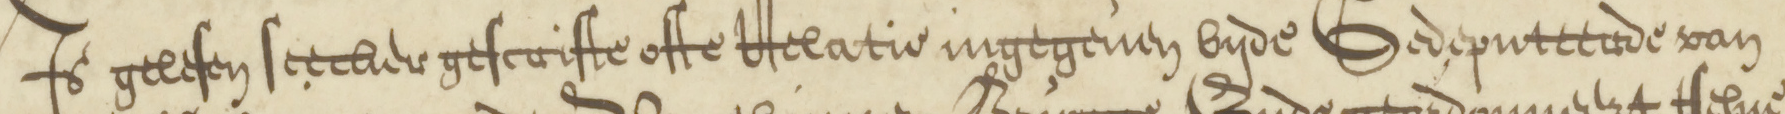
Is gelesen seecker gescrifte ofte Relatie ingegeuen byde Gedeputeerde van
